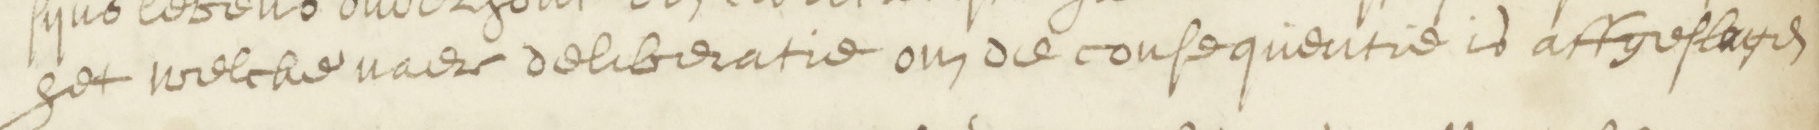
het welcke naer deliberatie om de consequentie is affgeslagen.
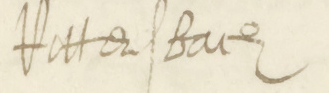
Rittersbach
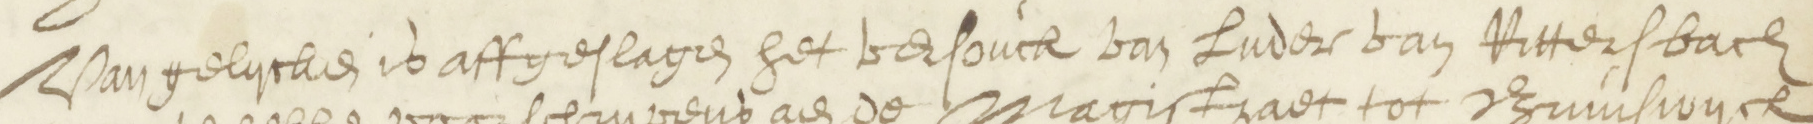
Van gelycken is affgeslagen het versouck van Luder van Rittersbach
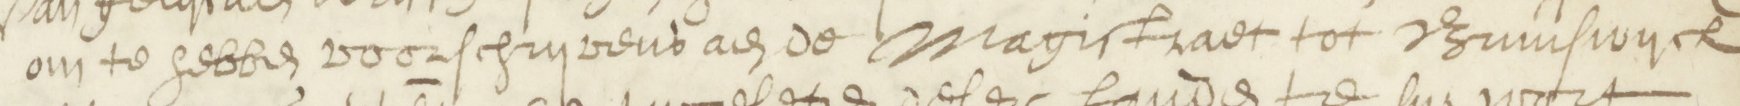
om te hebben voorschryvens aen de Magistraet tot Brunswyck
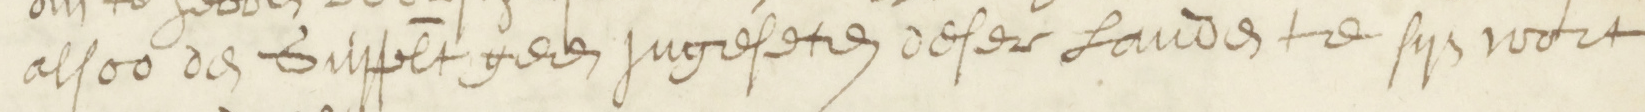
alsoo den Supplt geen ingeseten deser Landen te syn wort
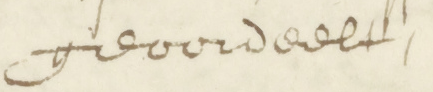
geoordeelt.
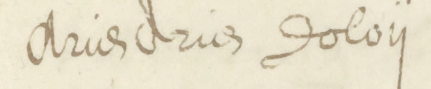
Arien Arien Doloij
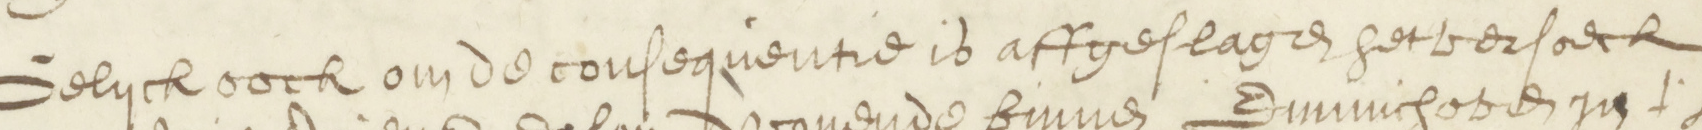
Gelyck oock om de consequentie is affgeslagen het versoeck
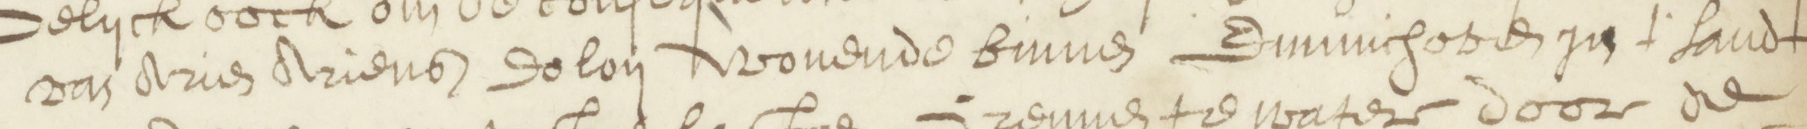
van Arien Ariens Doloy wonende binnen Emmichoven in t‛ Landt
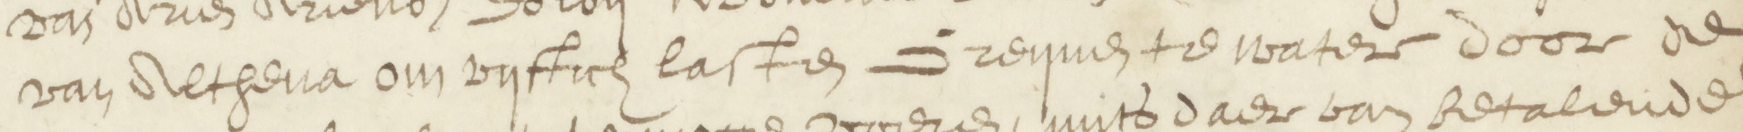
van Althena om vyftich lasten Greynen te water door de
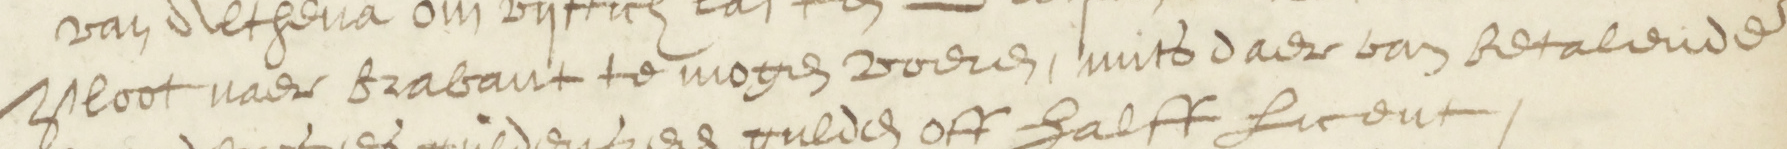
Vloot naer brabant te mogen voeren, mits daer van betalende
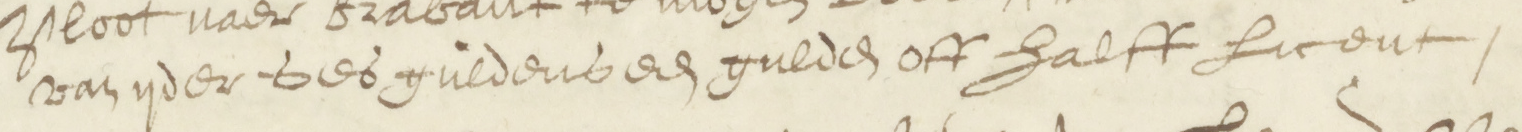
van yder ses guldens een gulden off halff Licent.
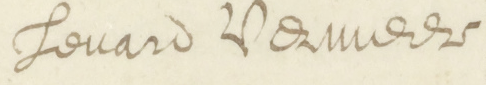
Lenard Vermeer
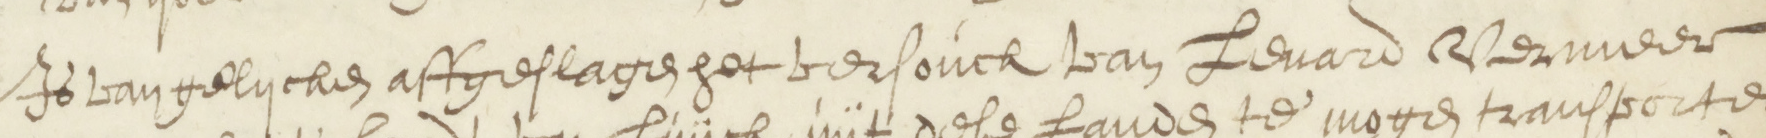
Is van gelycken affgeslagen het versouck van Lenard Vermeer
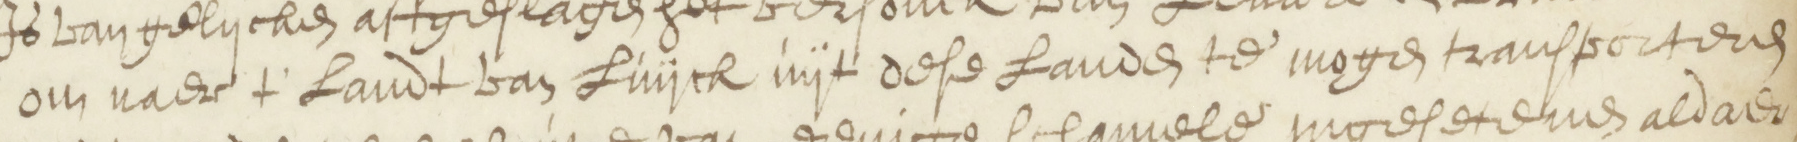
om naer t‛ Landt van Luijck uijt dese Landen te mogen transporteren
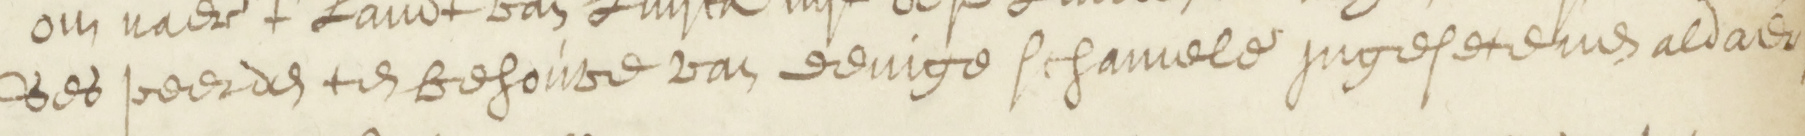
ses peerde ten behouve van eenige schamele ingesetenen aldaer.
